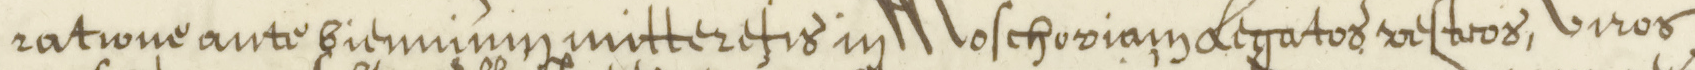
ratione ante biennium mitteretis in Moschoviam Legatos vestros, viros
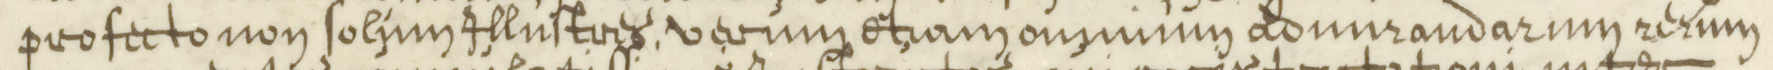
profecto non solum Illustres, verum etiam omnium admirandarum rerum
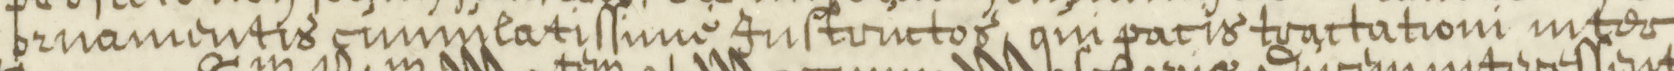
ornamentis cumulatissime Instructos, qui pacis tractationi inter
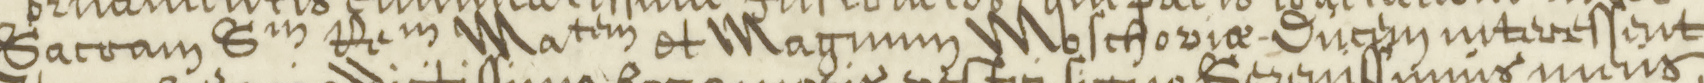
Sacram Sm Rem Matem et Magnum Moschoviæ Ducem interessent.
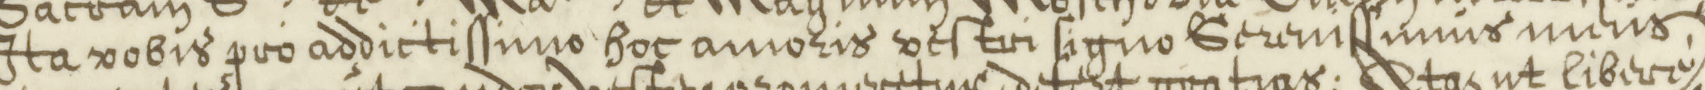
Ita vobis pro addictissimo hoc amoris vestri signo Serenissimus meus
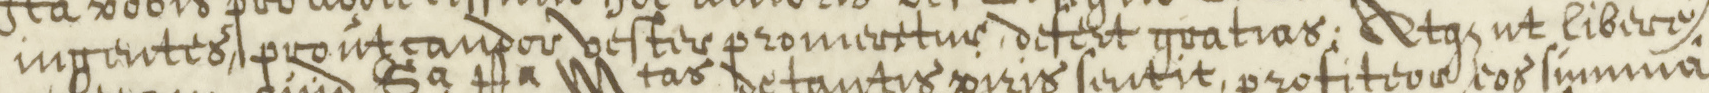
ingentes, prout candor vester promeretur, defert gratias; Atque ut libere
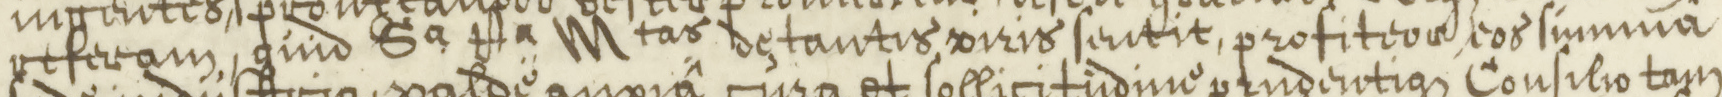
referam, quid Sa Ra Mtas de tantis viris sentit, profiteor eos summa
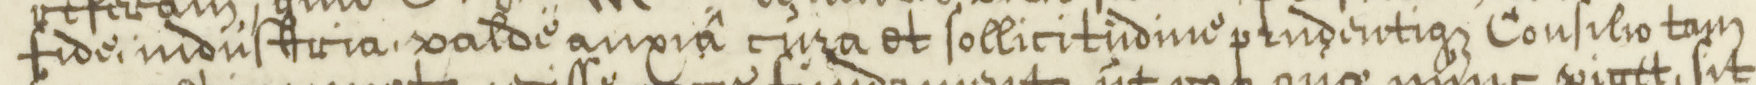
fide, industria, valde anxia cura et sollicitudine prudentique Consilio tam
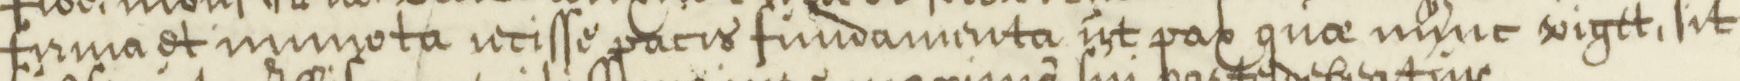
firma et immota iecisse pacis fundamenta ut pax quæ nunc viget, sit
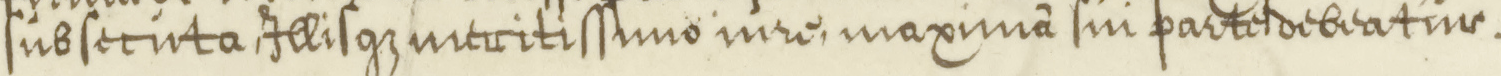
sub secuta, Illisque meritissimo iure maxima sui parte debeatur.
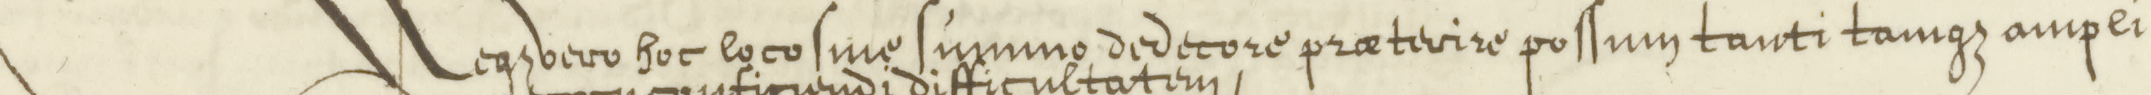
Neque vero hoc loco sine summo dedecore præterire possum tanti tamque ampli
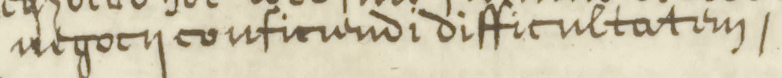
negocii conficiendi difficultatem.
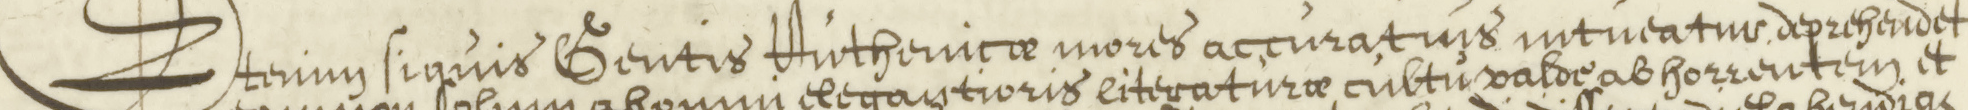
Etenim si quis Gentis Ruthenicæ mores accuratius intueatur deprehendet
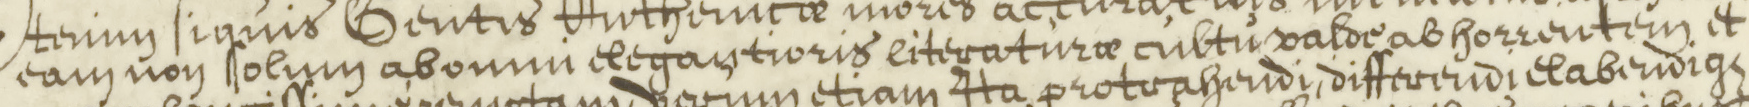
eam non solum ab omni elegantioris literaturæ cultu valde ab horrentem et
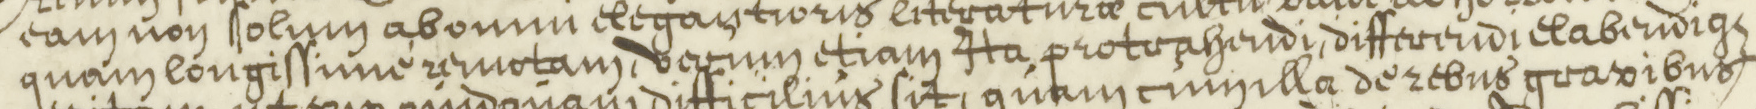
quam longissime remotam, verum etiam Ita protrahendi, differendi elabendique
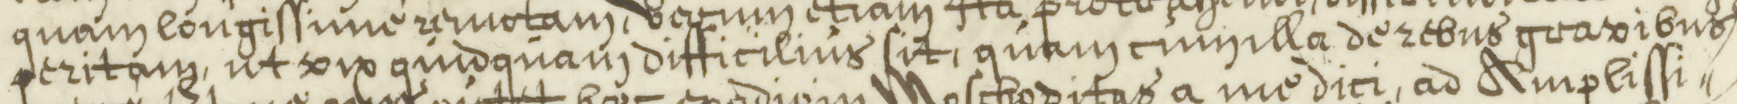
peritam, ut vix quidquam difficilius sit, quam cum illa de rebus gravibus
